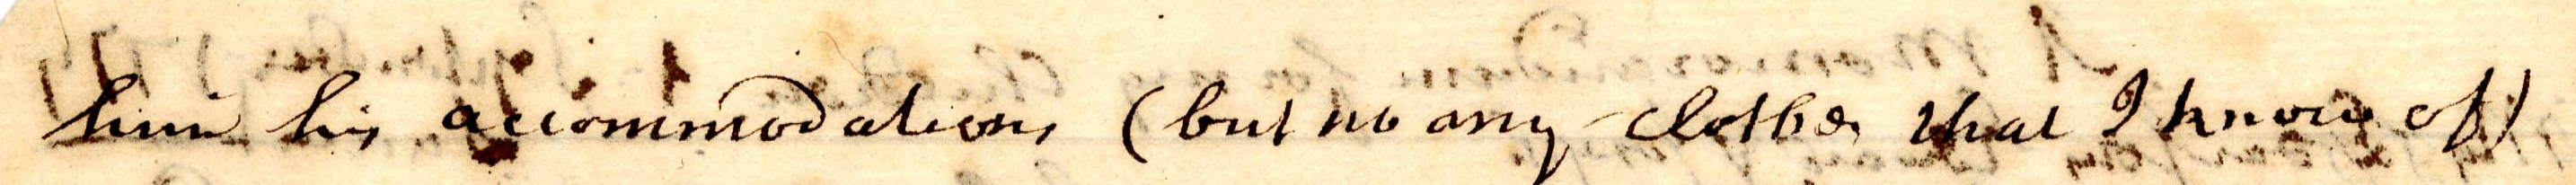him his accommodations (but no any cloths that I know of)
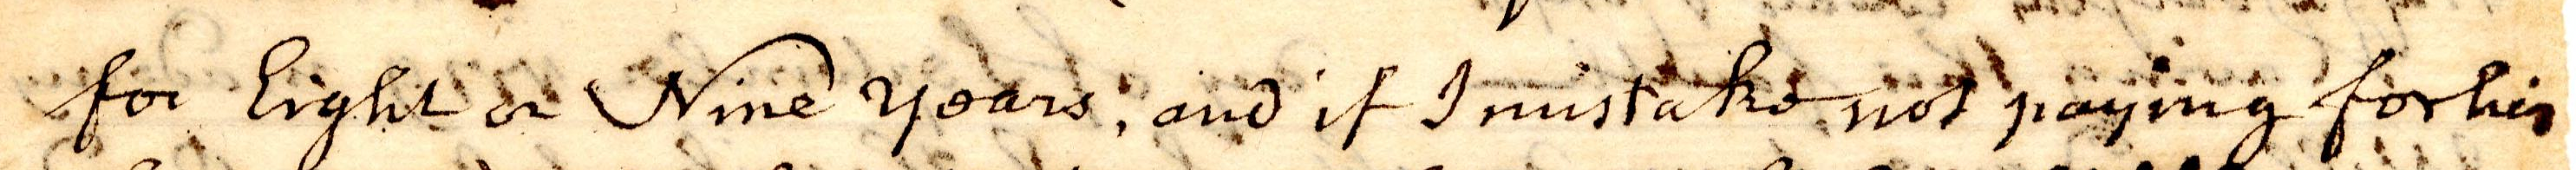for Eight or Nine years; and if I mistake not paying for his
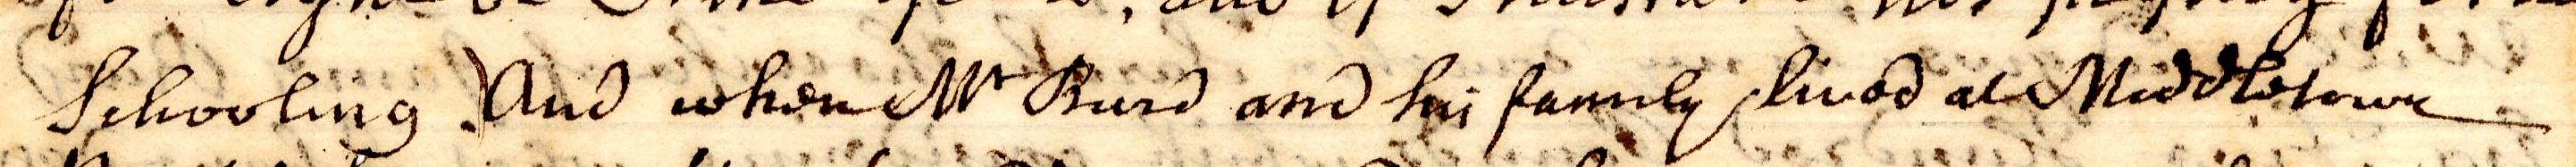Schooling. And when M^r Burd and his family lived at Middletown
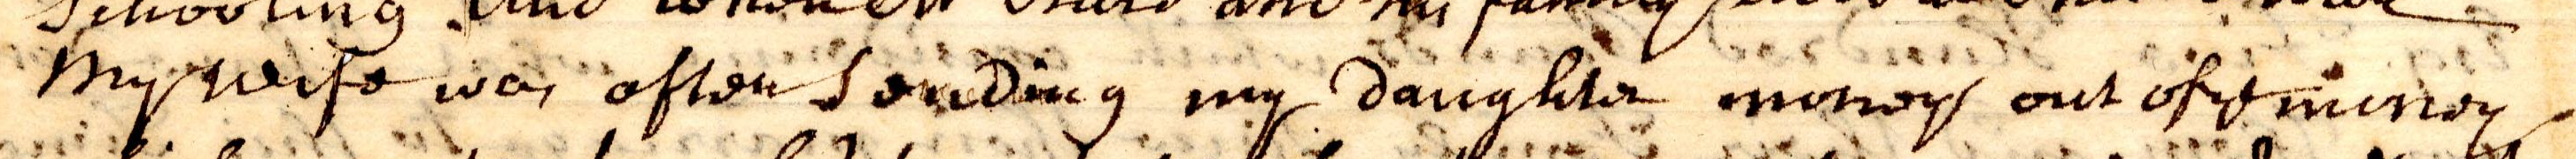My Wife was often sending my daughter money out of y^e money
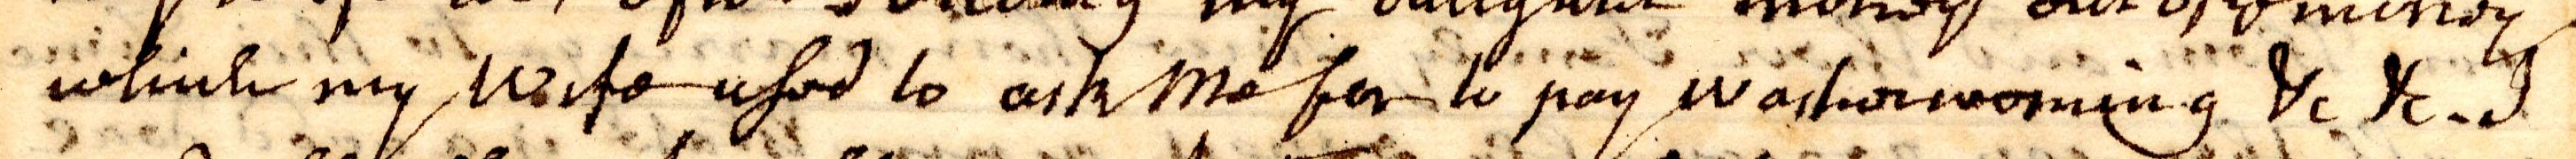which my Wife used to ask Me for to pay Washerwoming &c. &c. I
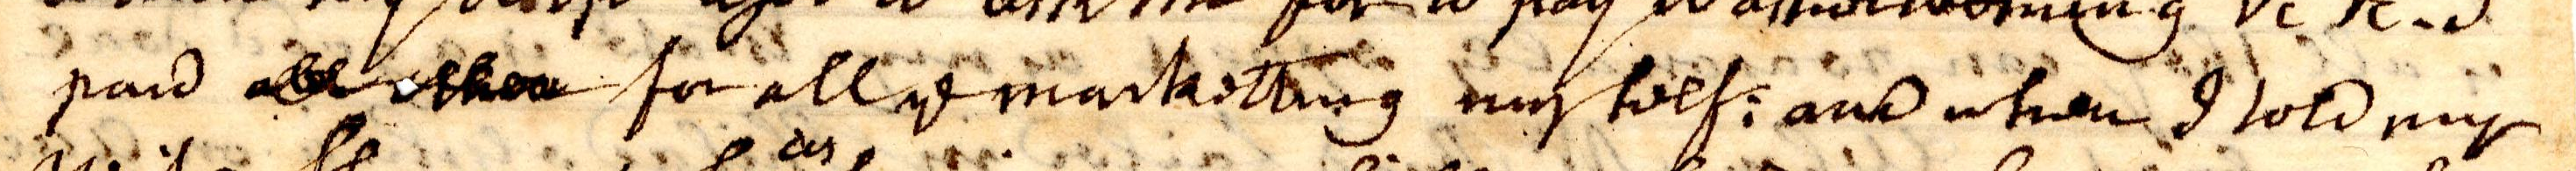paid [all] [___] for all y^e marketting my self: and when I told my
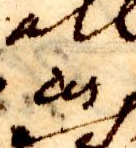as
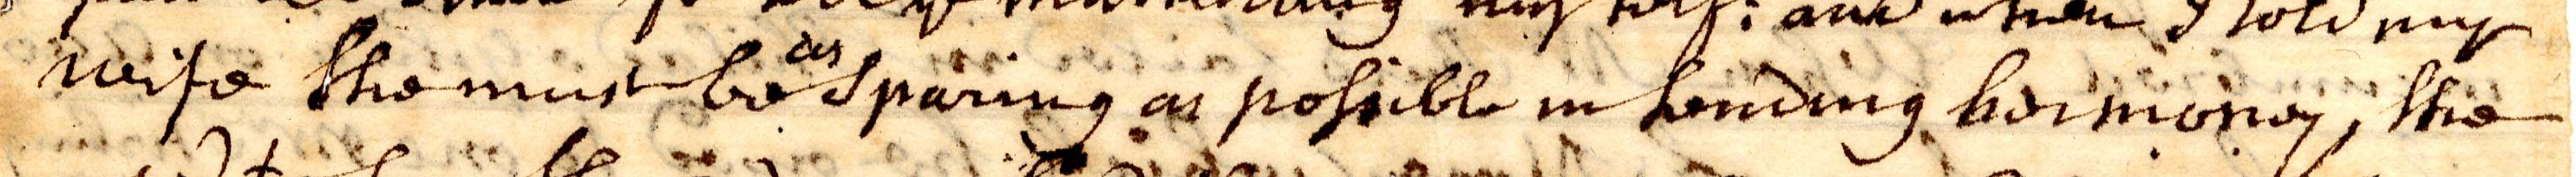wife She must be ^ sparing as possible in Lending her money, She
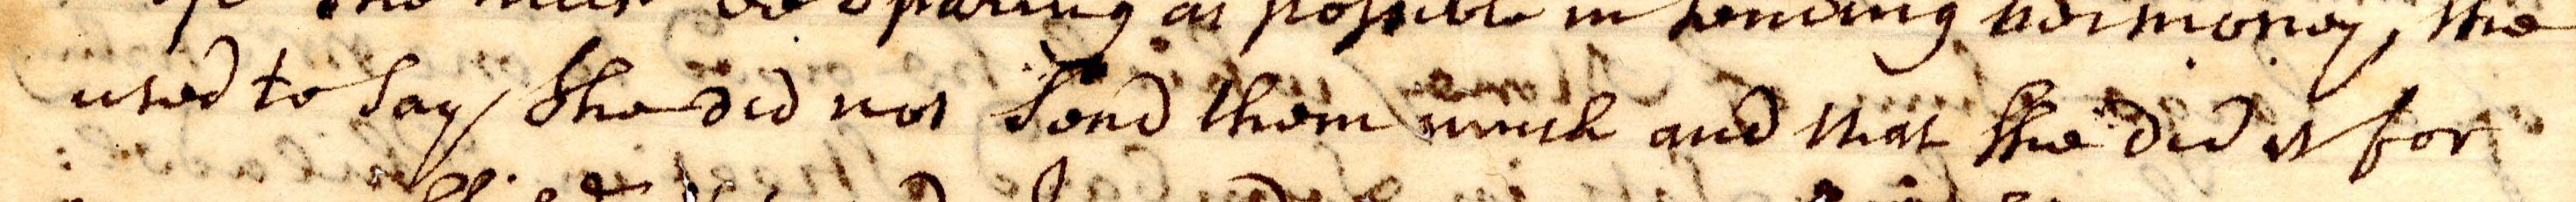used to Say She did not Send them much and that she did it for
